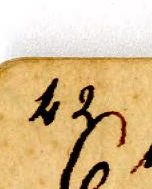42
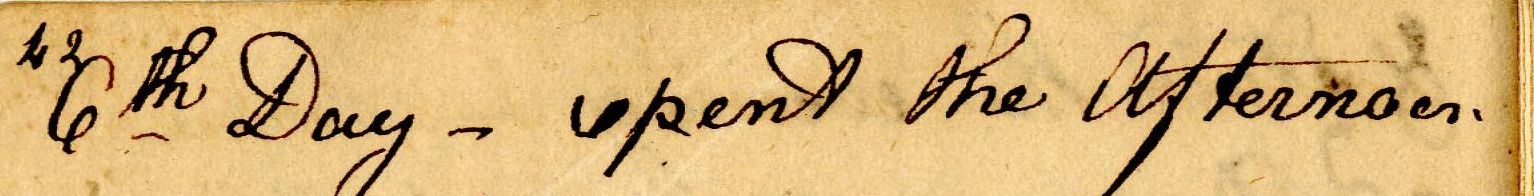6^th Day- spent the Afternoon
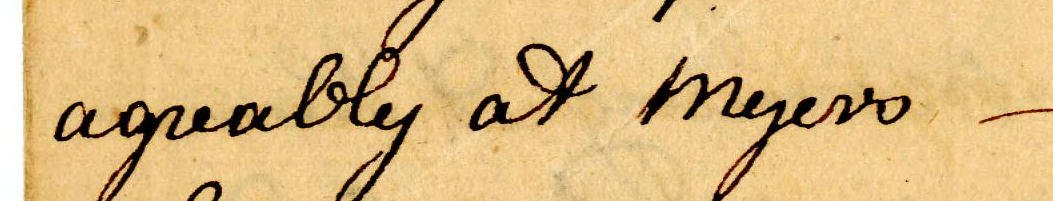agreably at Myers-
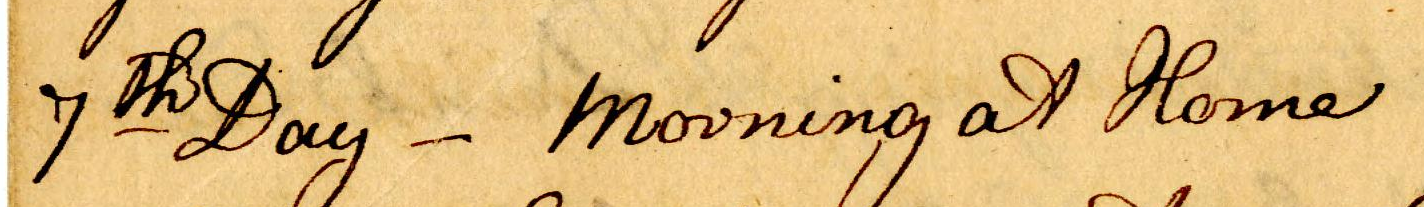7^th Day- Morning at Home
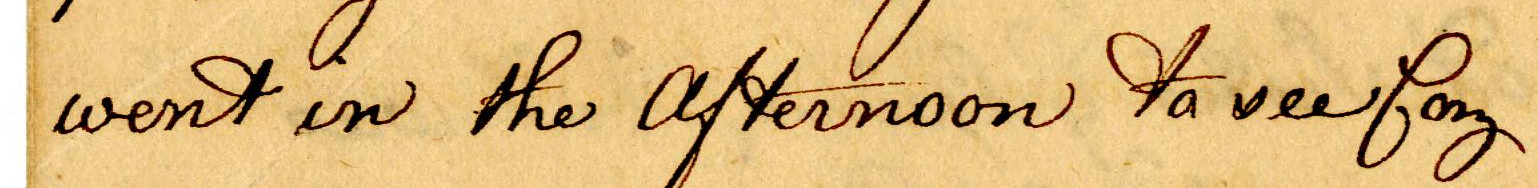went in the Afternoon to see Coz
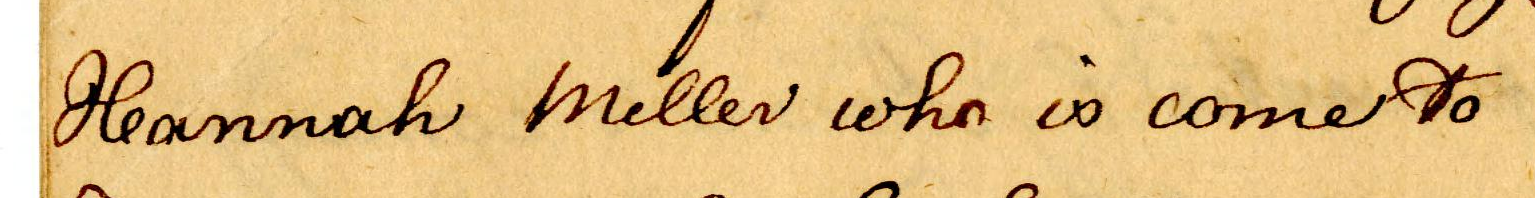Hannah Miller who is come to
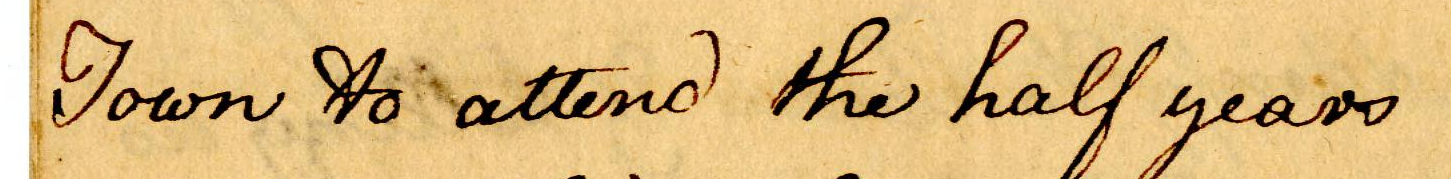Town to attend the half years
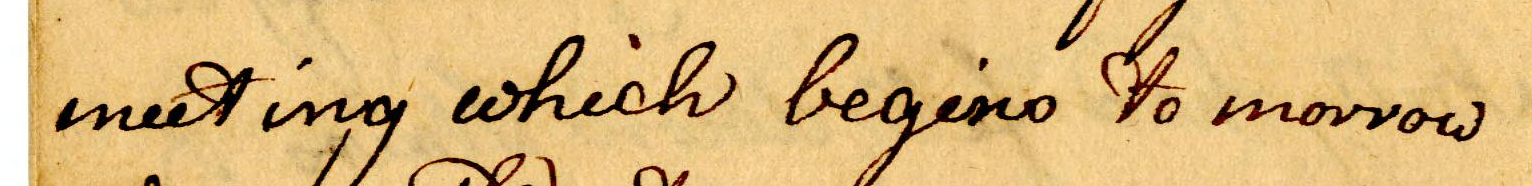meeting which begins to morrow
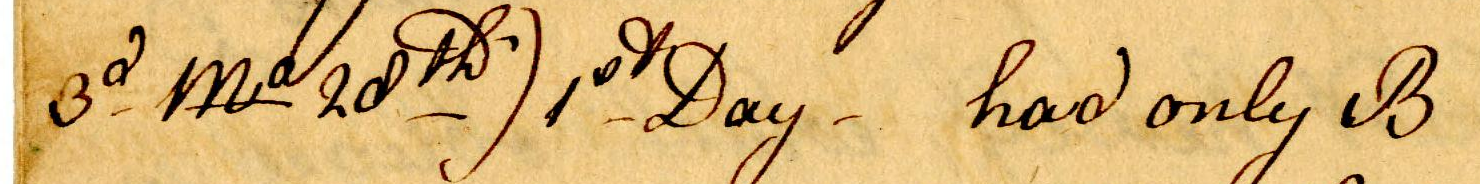3^d M^o 28^th) 1^st Day- had only B
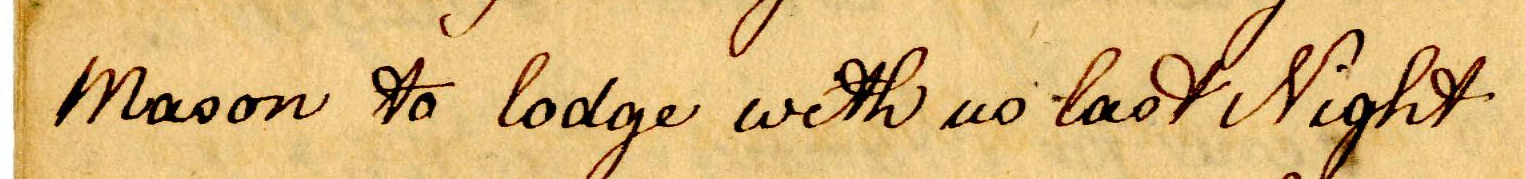Mason to lodge with us last Night
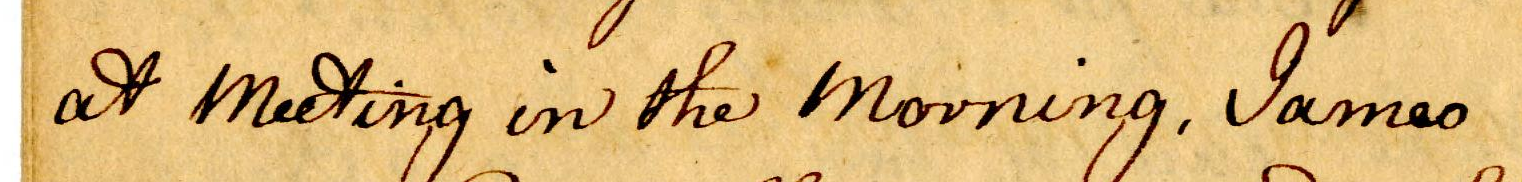at Meeting in the Morning, James
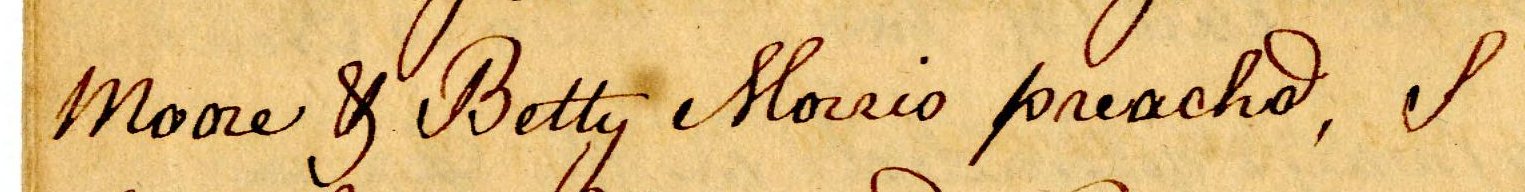Moore & Betty Morris preachd, S
